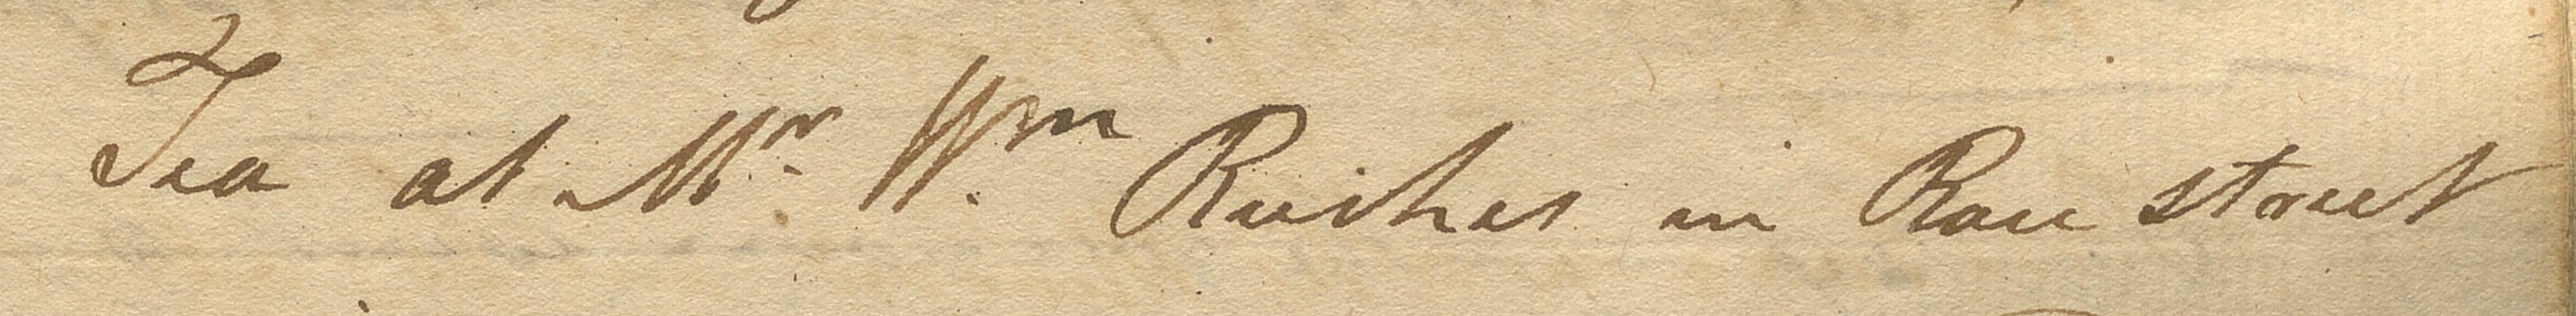Tea at M^r. W^m. Rushes in Race street
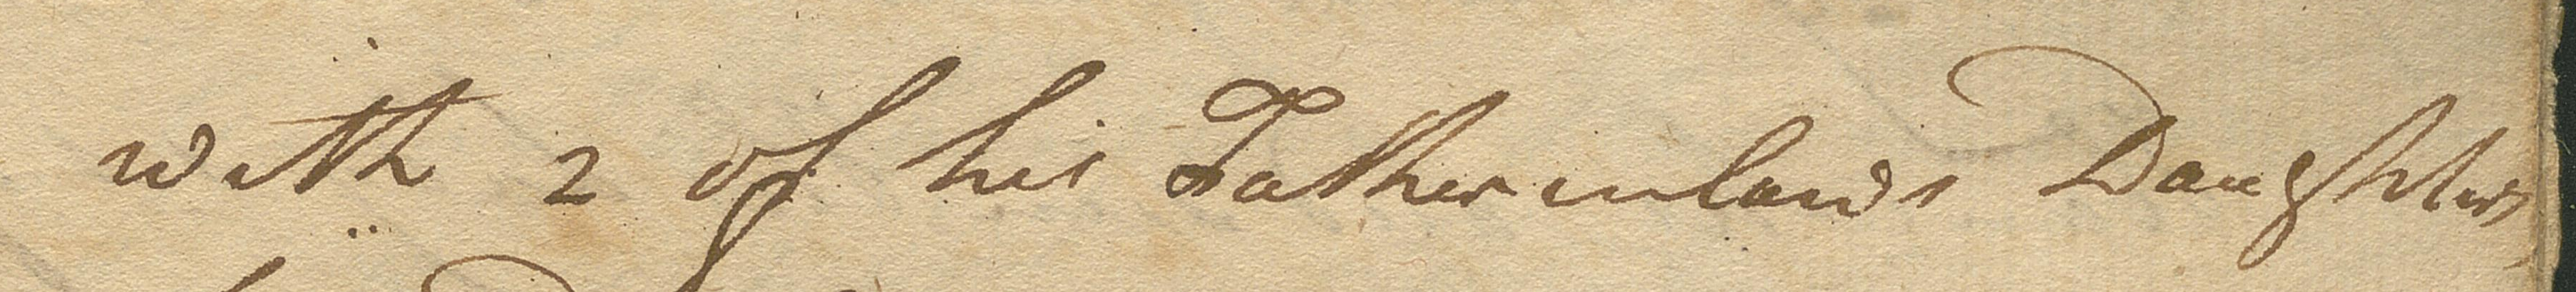with 2 of his Father in laws Daughter
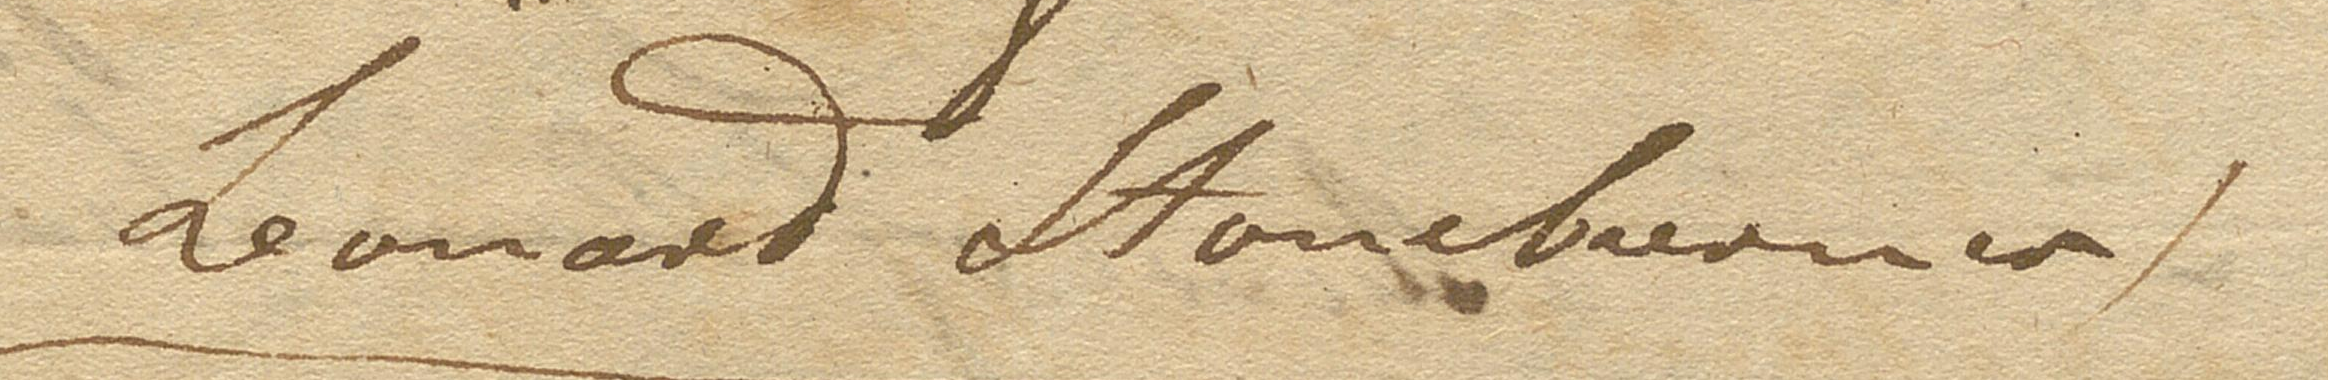Leonard Stoneburner /
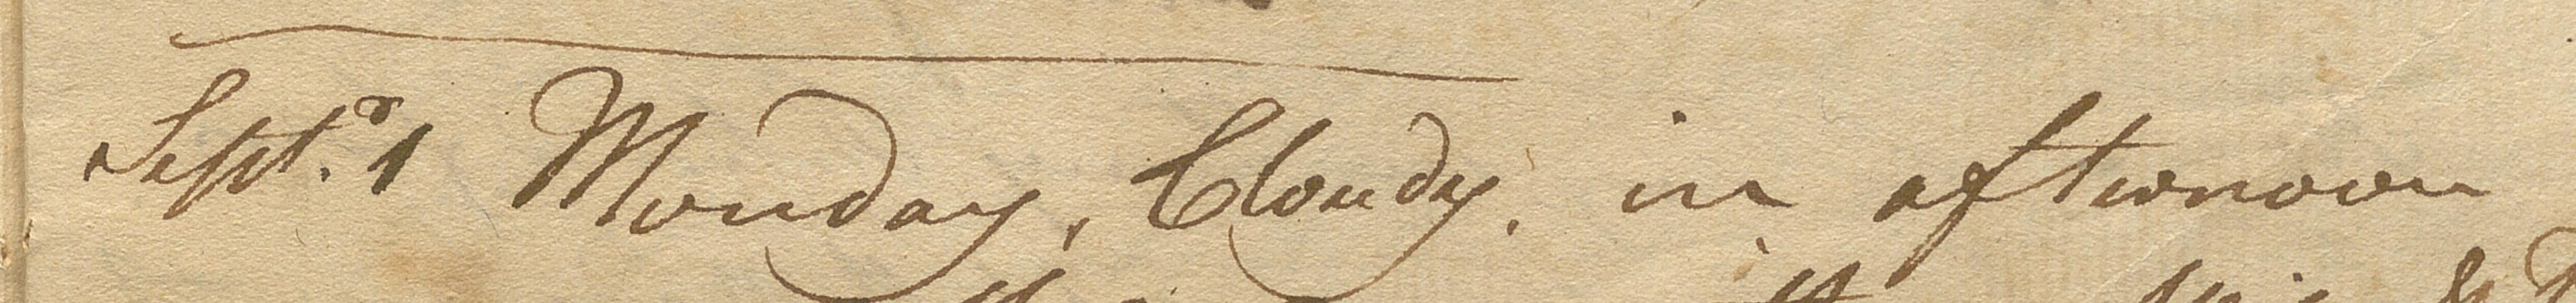Sept^r. 1 Monday, Cloudy in afternoon
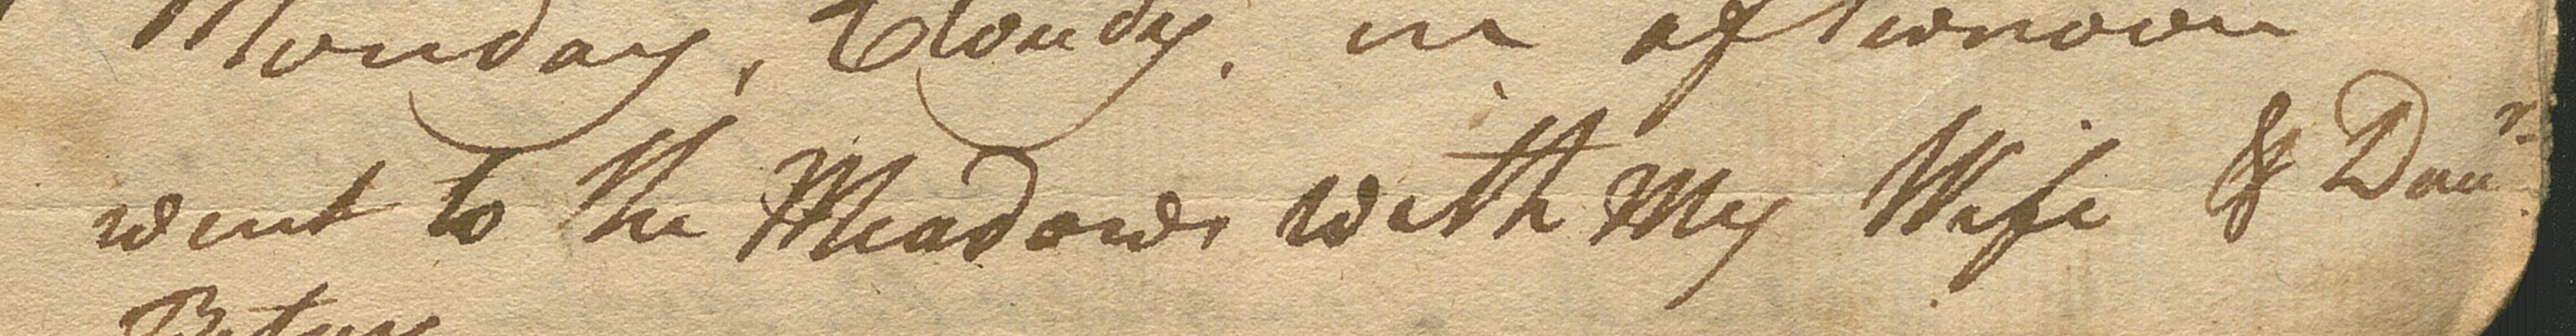went to the Meadows with My Wife & Dau^r.
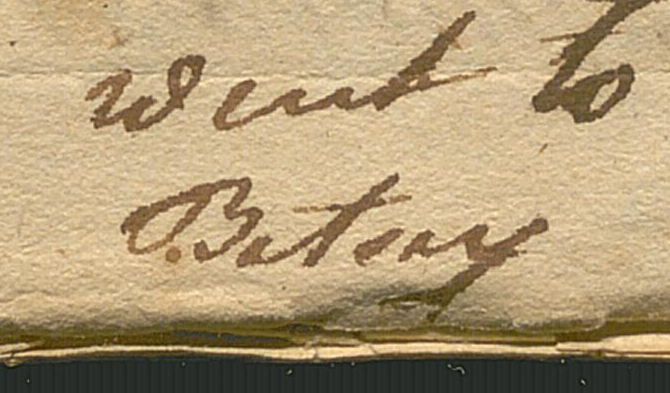Betsey
